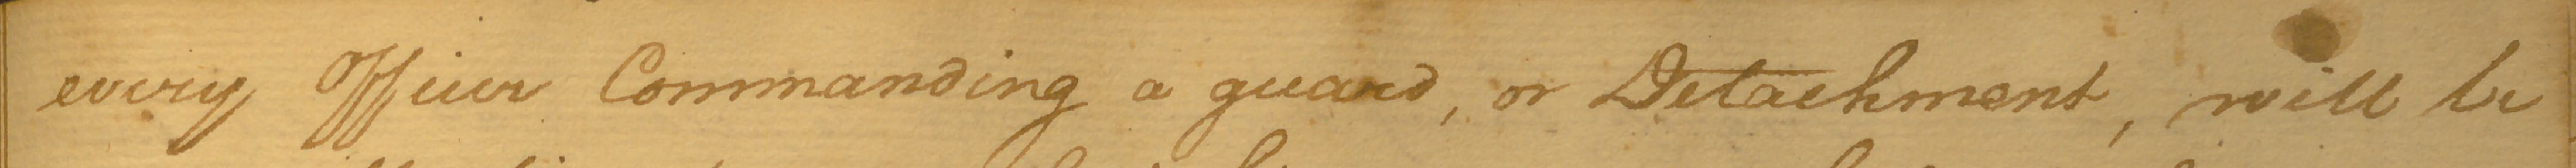every officer Commanding a guard, or Detachment, will be
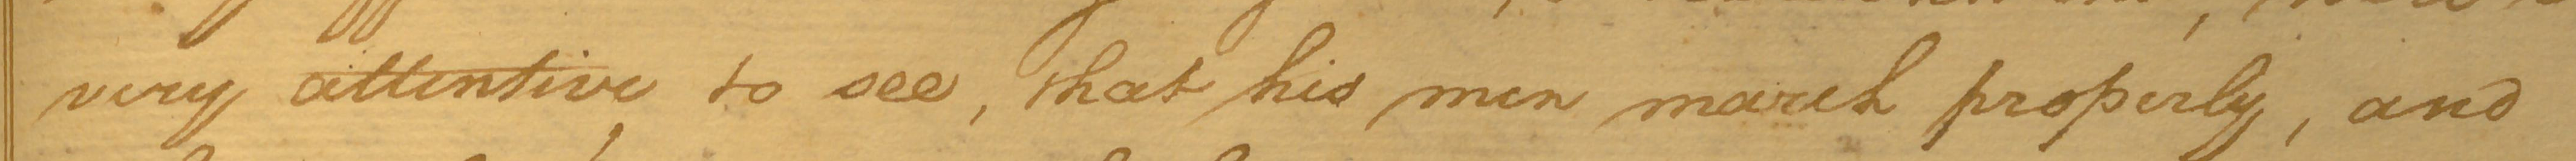very attentive to see, that his men march properly, and
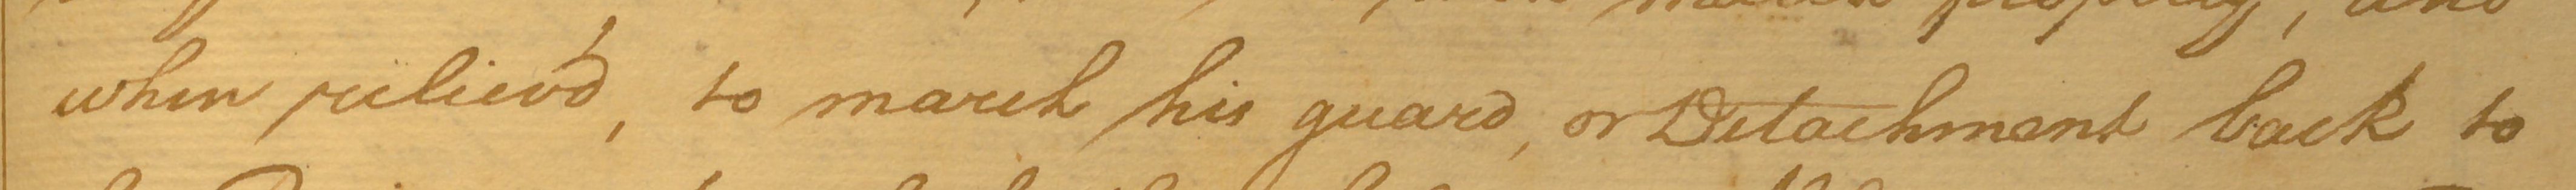when reliev'd, to march his guard or Detachment back to
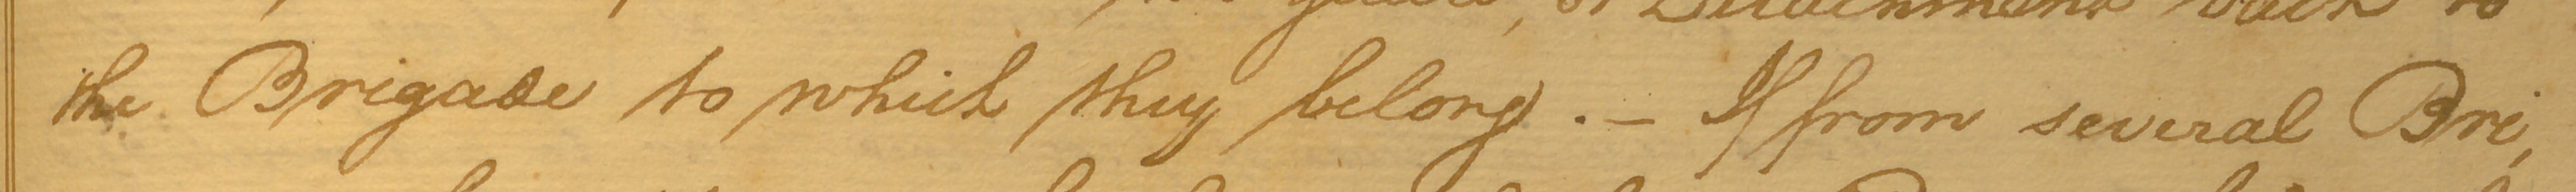the Brigade to which they belong.- If from several Bri-
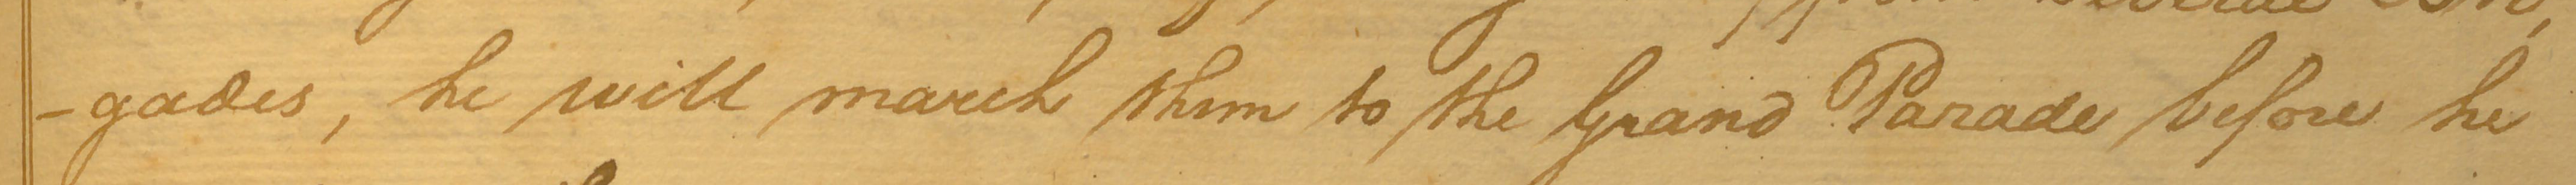-gades, he will march them to the Grand Parade before he
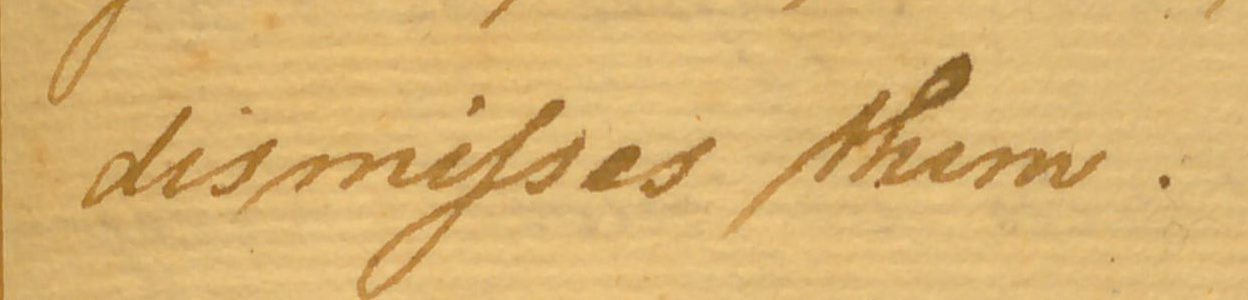dismisses them.
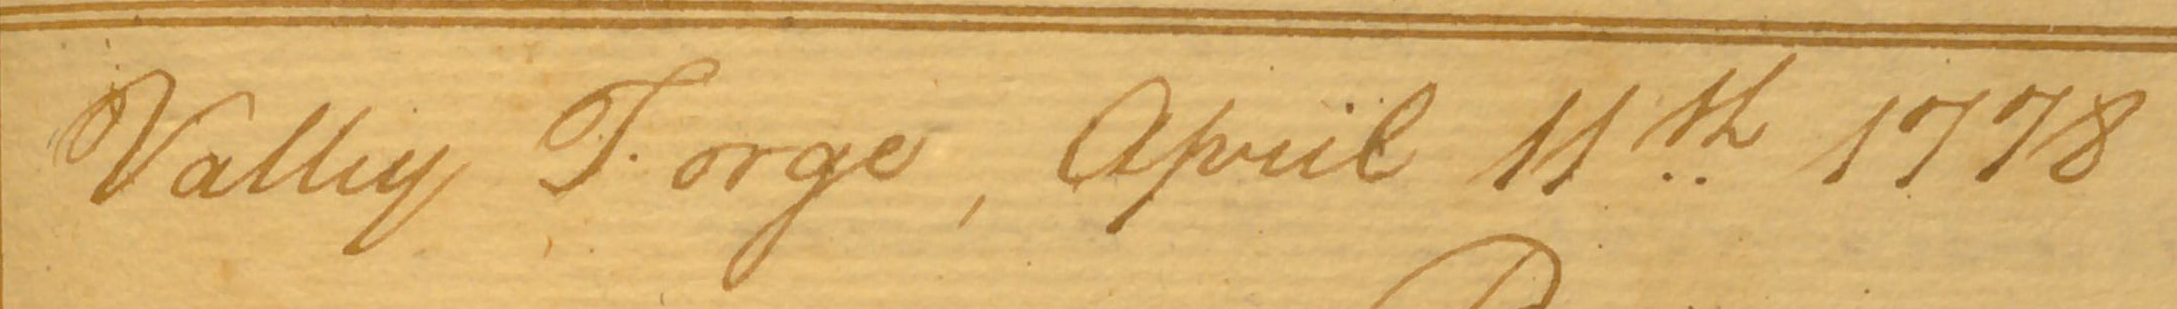Valley Forge, April 11^th. 1778
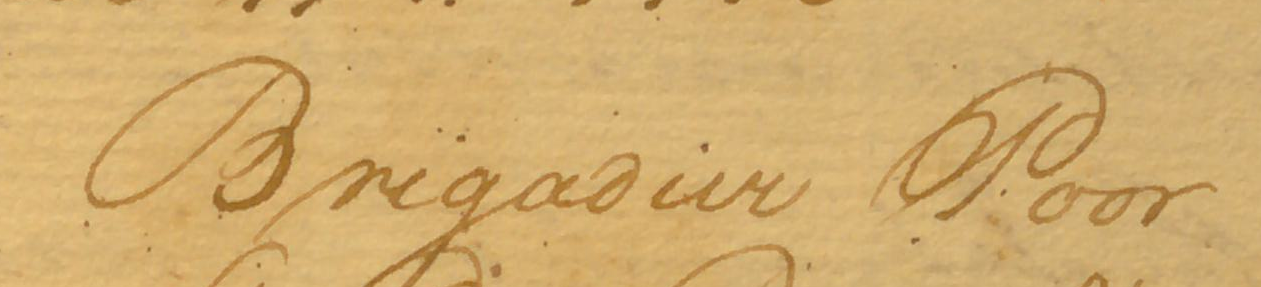Brigadier Poor
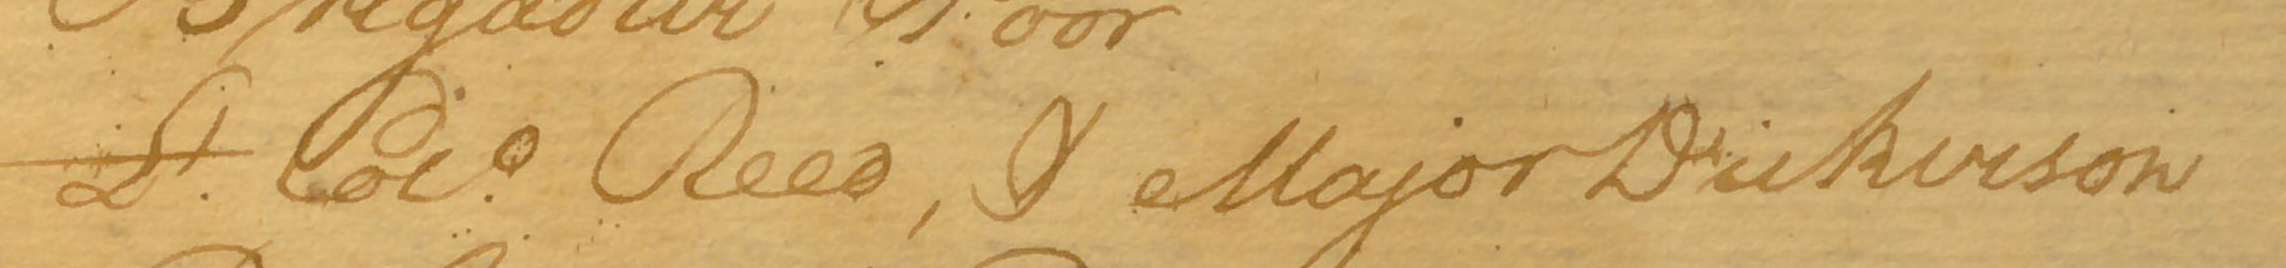L^t. Col^o. Reed, & Major Dickerson
